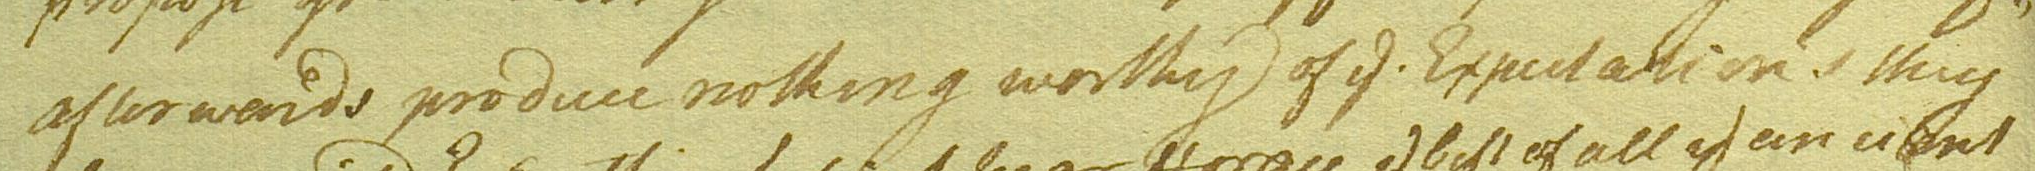afterwards produce nothing worthy of y^e Expectations they
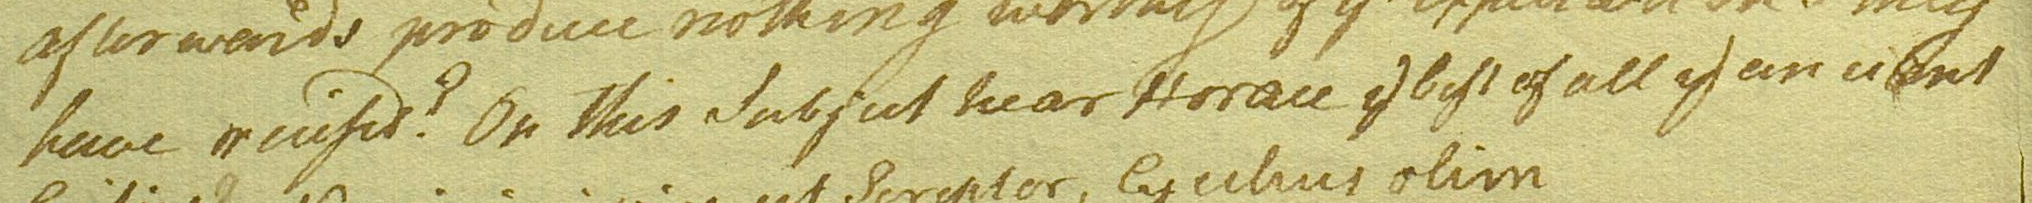have raised? On this Subject hear Horace y^e best of all y^e ancient
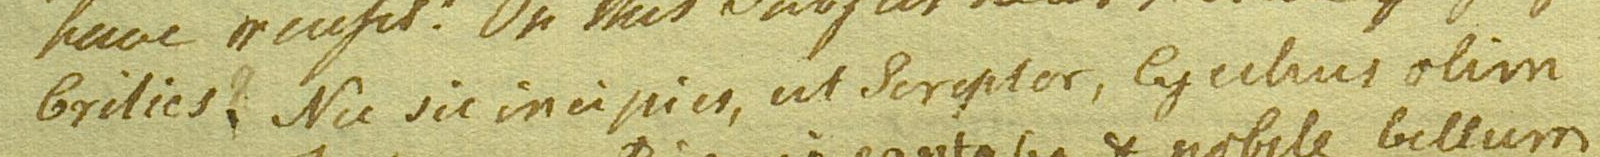Critics. Nec sic incipies, ut Scriptor, cyclicus olim
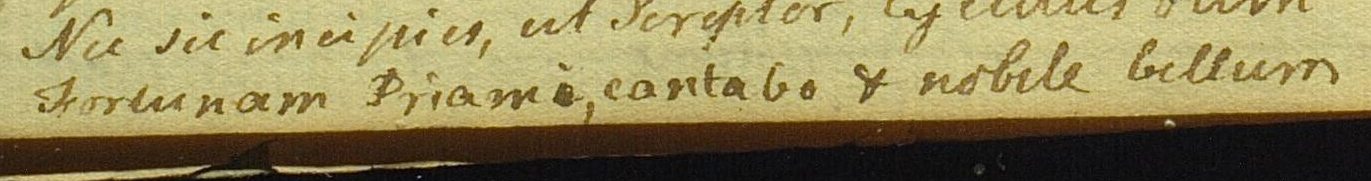Fortunam Priami, cantabo & nobile bellum
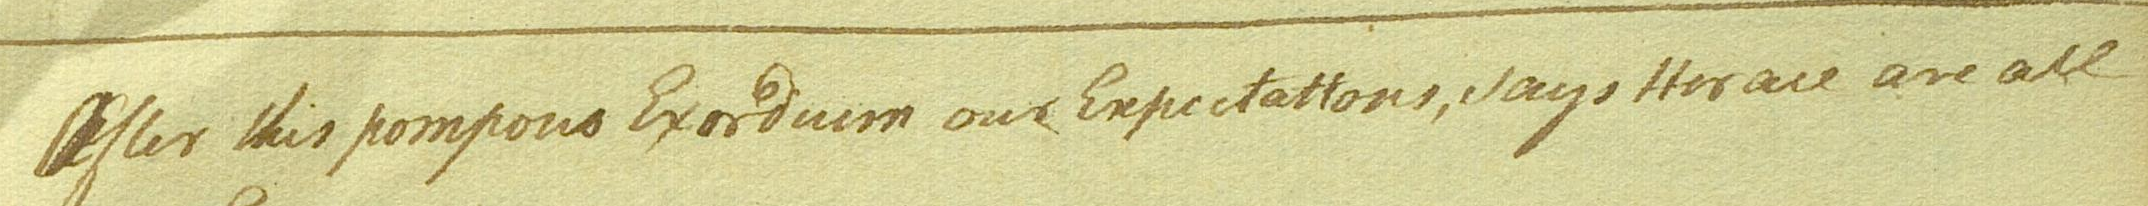After this pompous Exordium our Expectations, says Horace are all
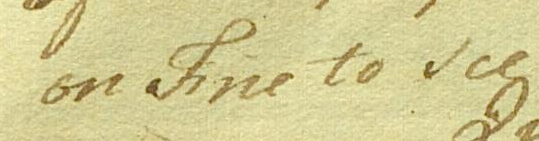on Fire to Ice.
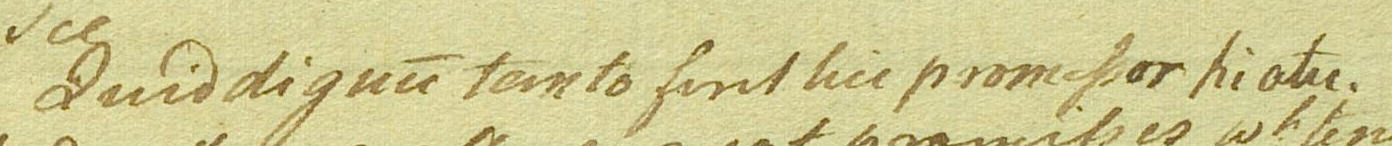Quid dignu tanto feret hic promissor hiatu.
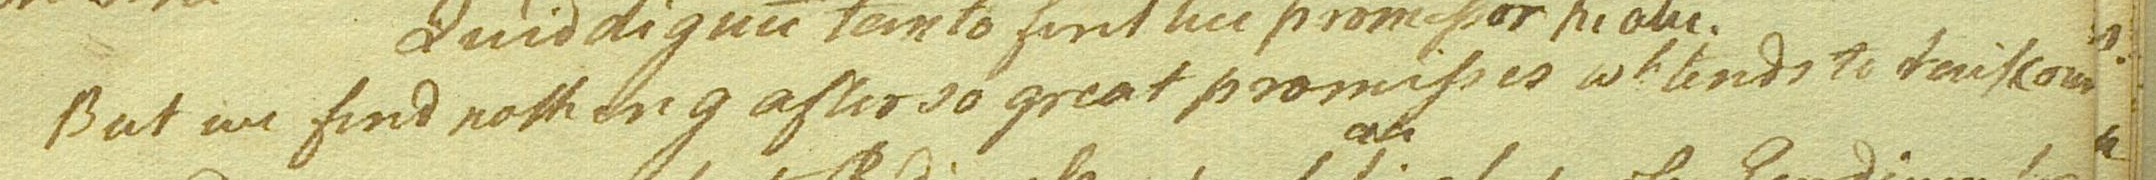But we find nothing after so great promises w^h tends to transcen
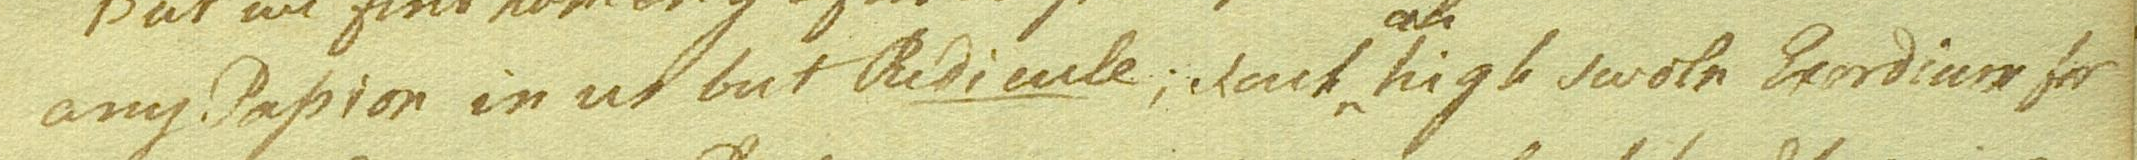any Passion in us but Ridicule; such ^an high sworn Exordium for
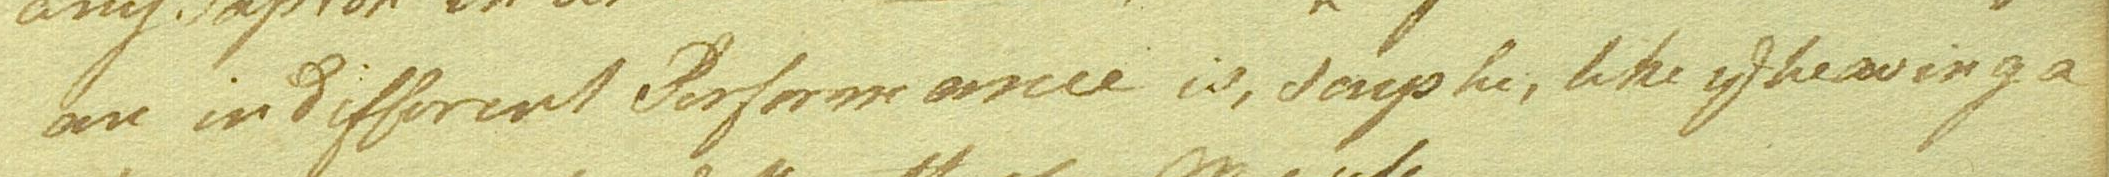an indifferent Performance is, says he, like y^e heaving a
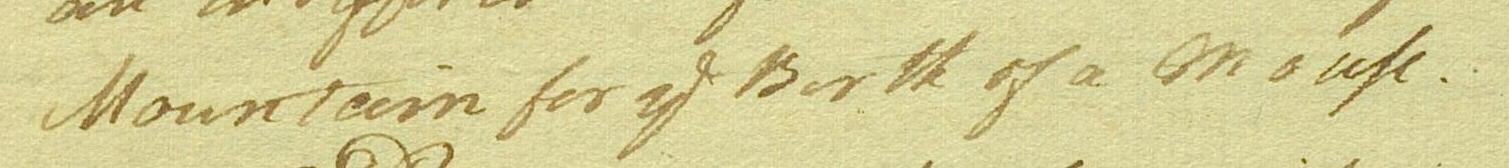Mountain for y^e Birth of a Mouse.
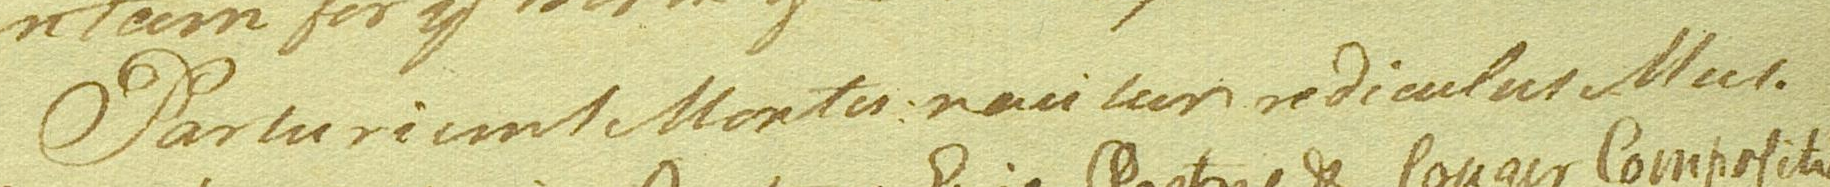Parturient Montes nascitur ridiculus Mus.
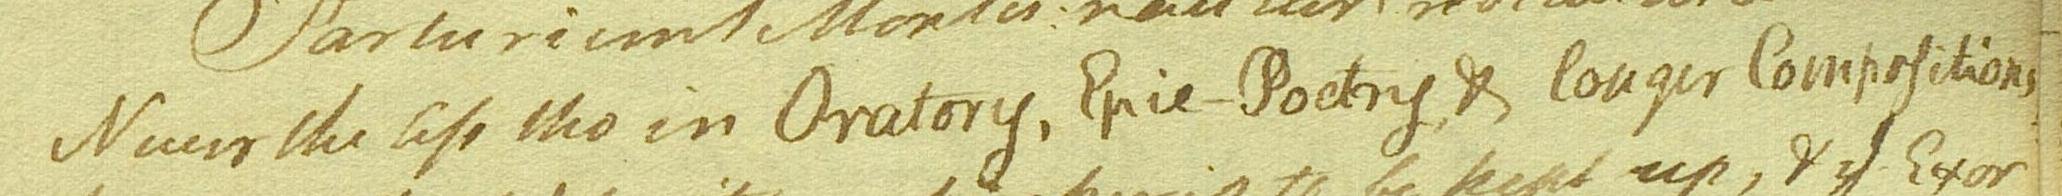Never the less tho in Oratory, Epic-Poetry & longer Compositions
